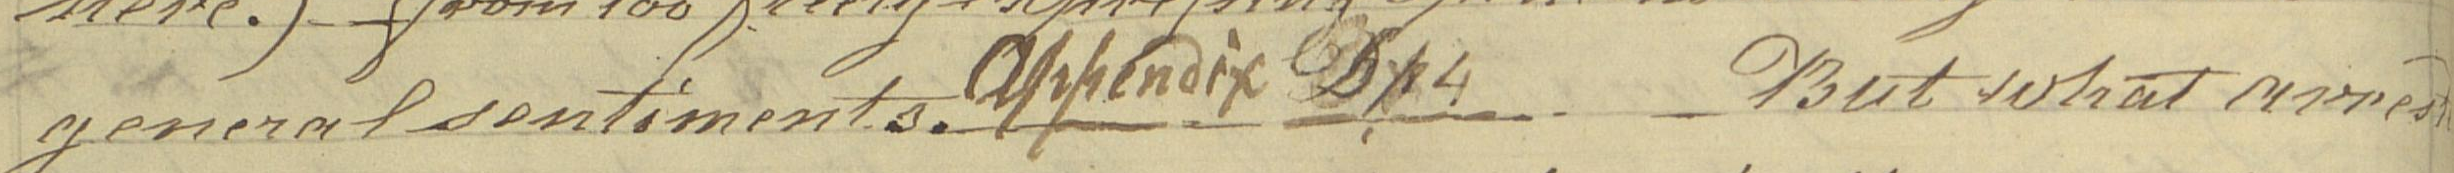general sentiments. Appendix D p 4 But what arres-
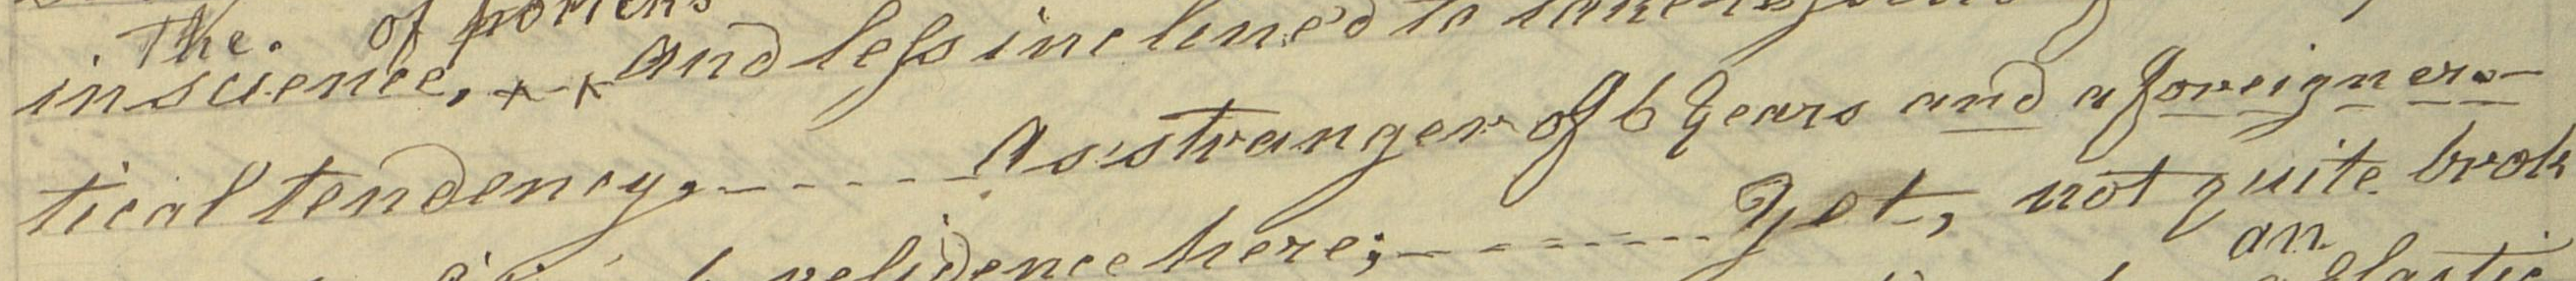-tical tendency. As stranger of 6 Years and a foreigner
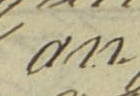am
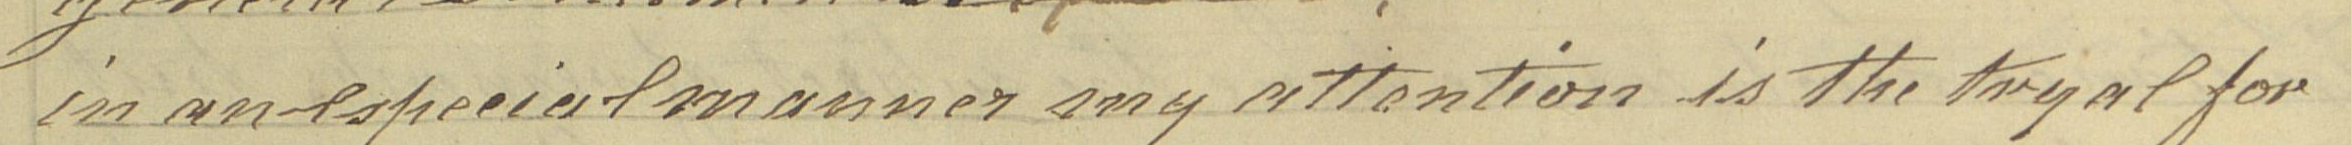in an especial manner my attention is the tryal for
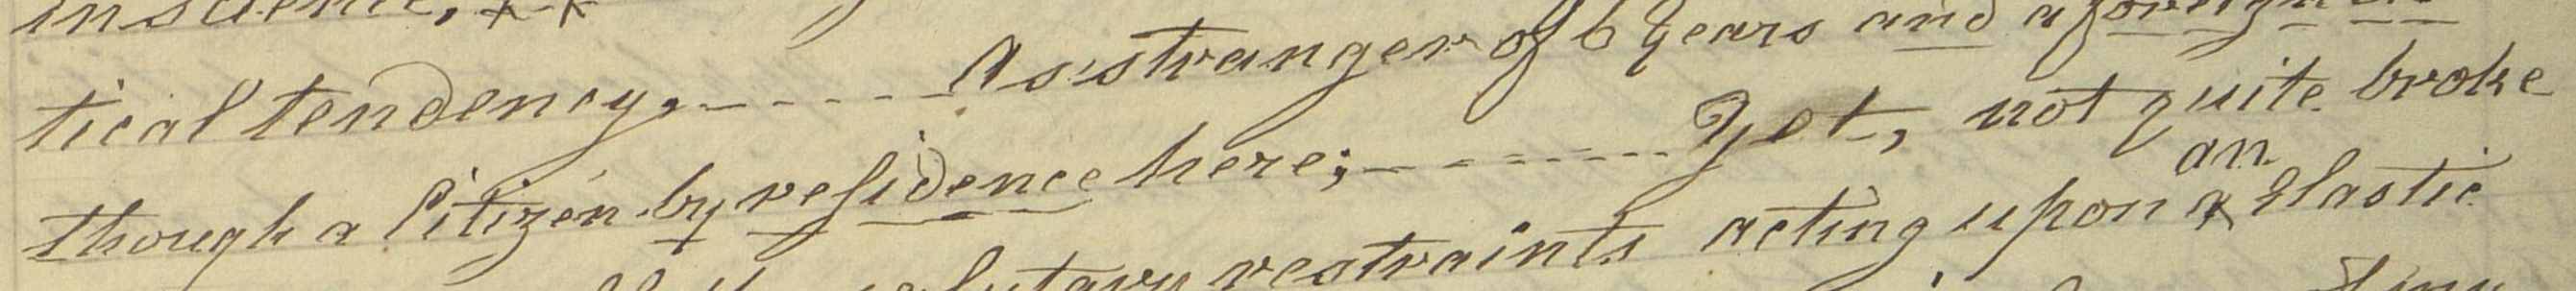though a Citizen by residence here; Yet, not quite broke
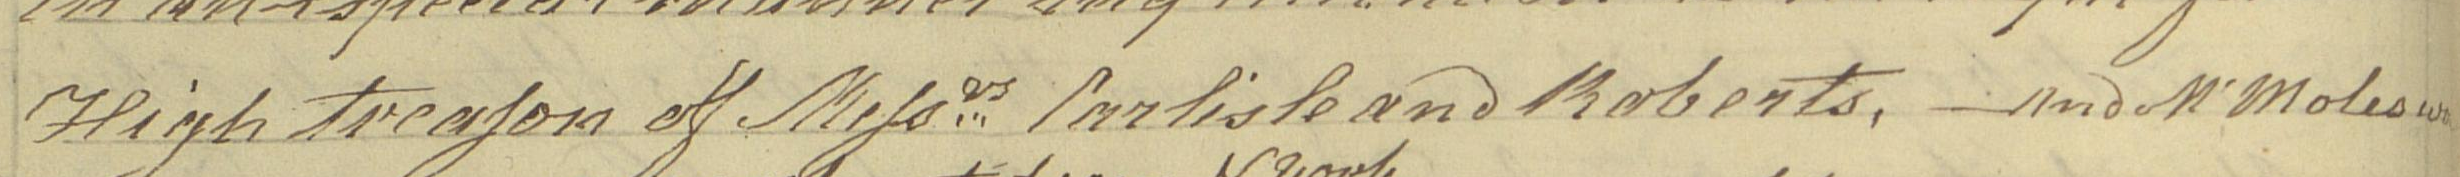High treason of Mess^rs. Carlisle and Roberts, and M^r Moles w-
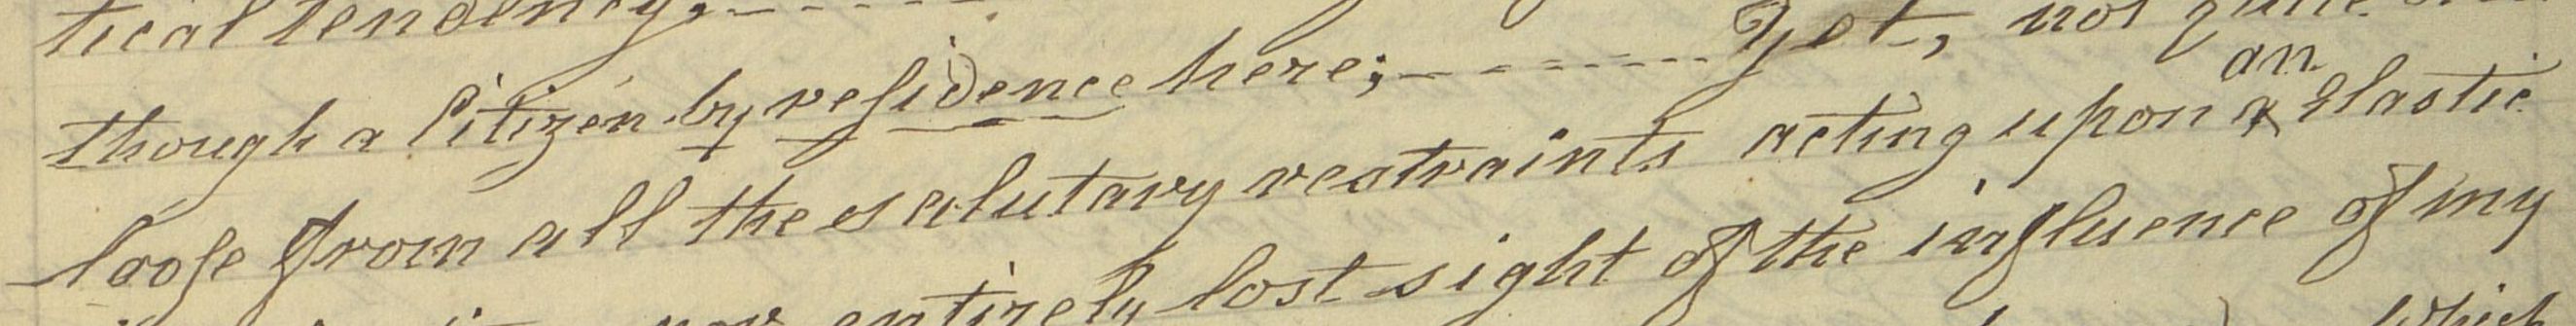loose from all the salutary restraints acting upon ^ Elastic
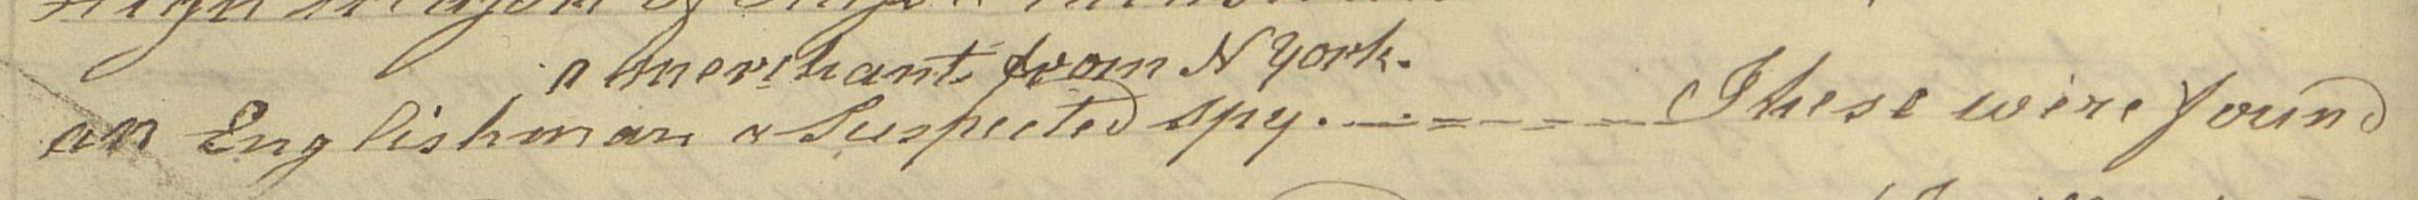an Englishman ^ a Suspected spy. These were found
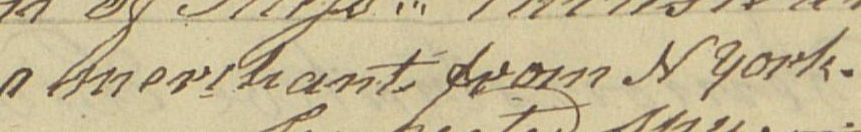a merchant from N York.
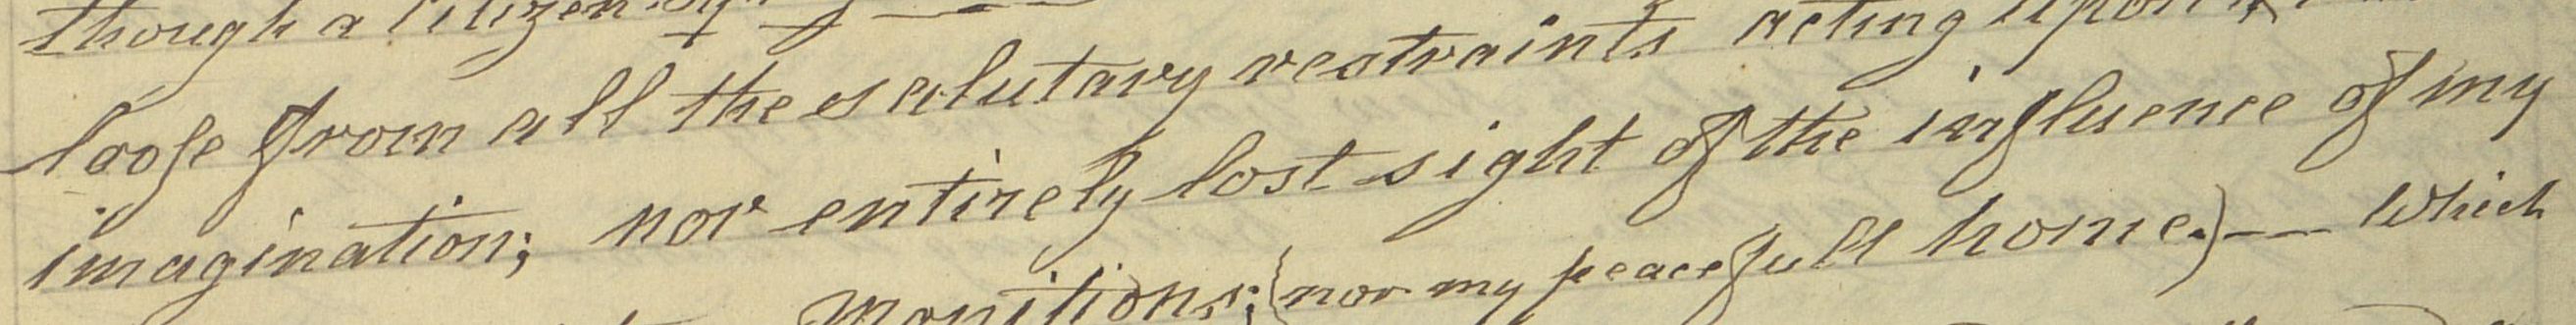imagination; nor entirely lost sight of the influence of my
